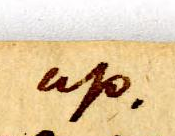up
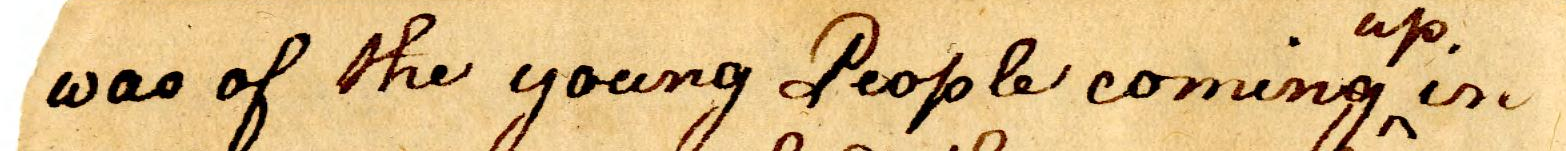was of the young People coming ^ in
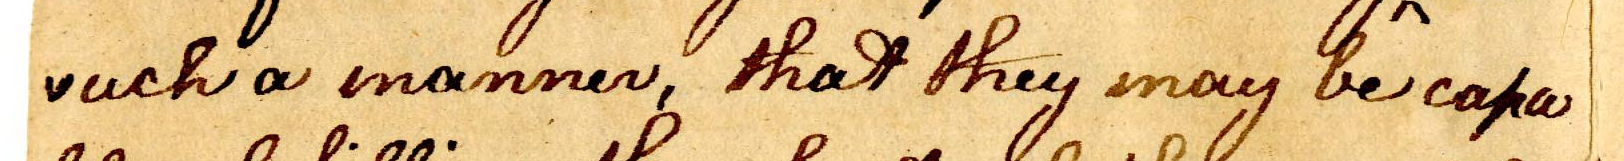such a manner, that they may be capa
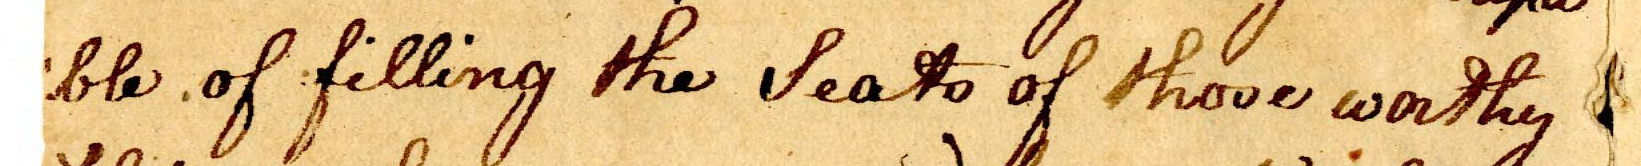ble of filling the Seats of those worthy
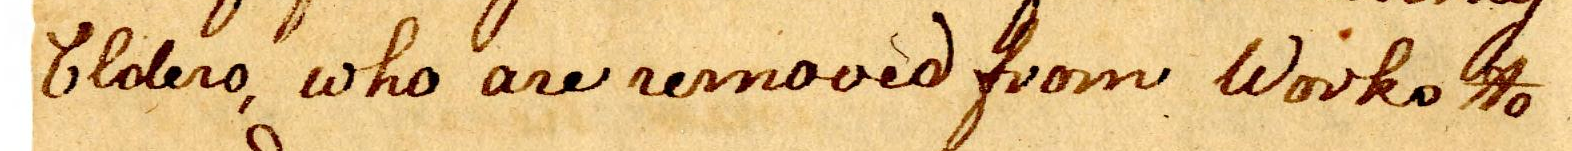Elders, who are removed from Works to
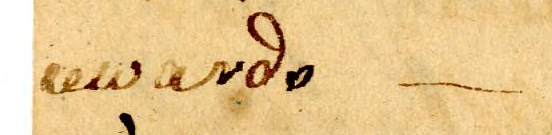rewards-
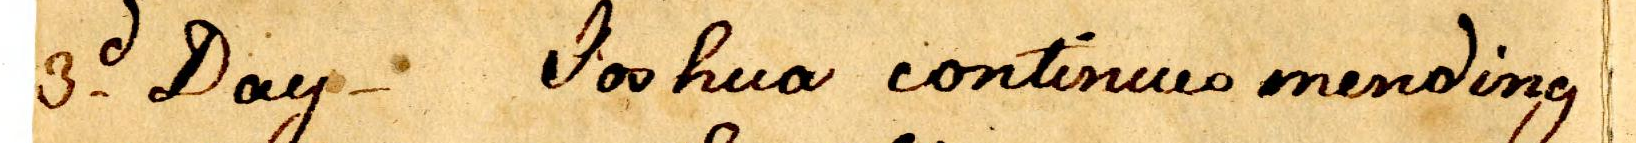3^d. Day- Joshua continues mending
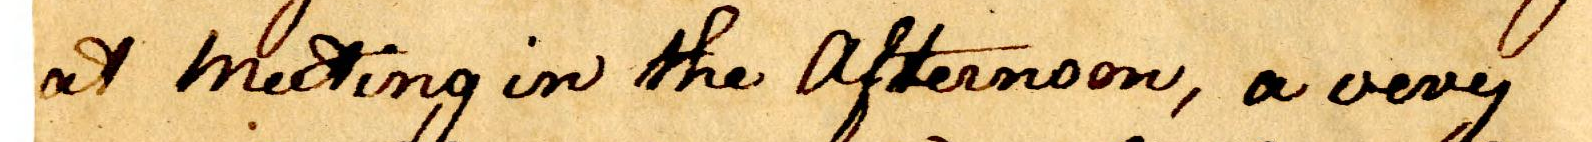at Meeting in the Afternoon, a very
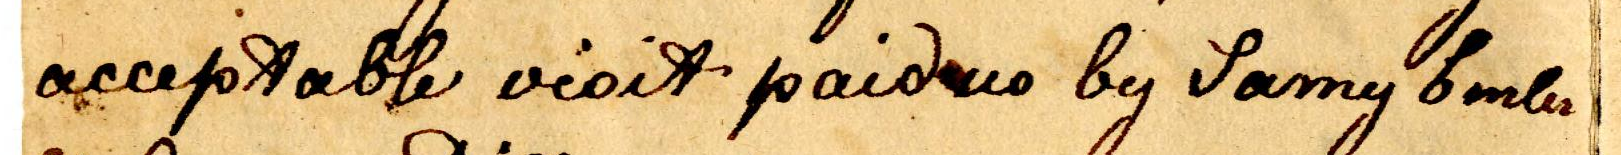acceptable visit paid us by Samy Emlen
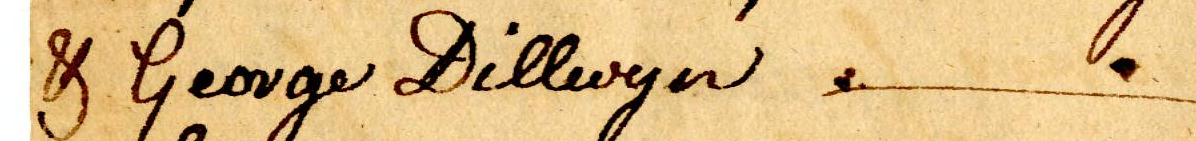& George Dillwyn-
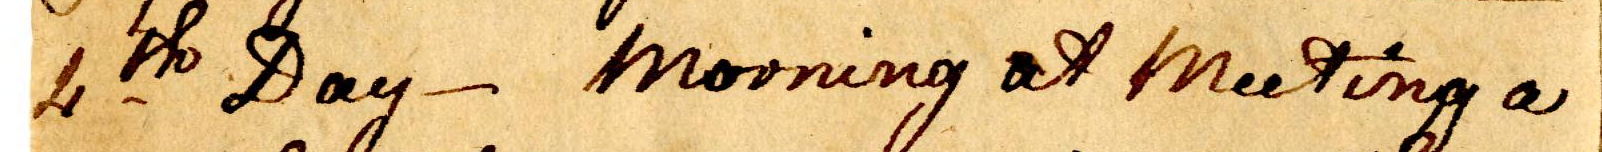4^th Day- Morning at Meeting a
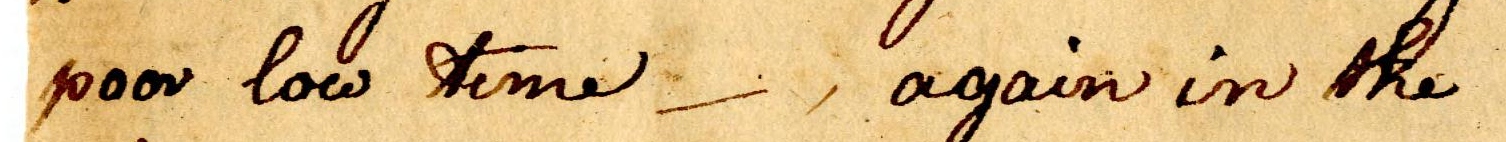poor low time- again in the
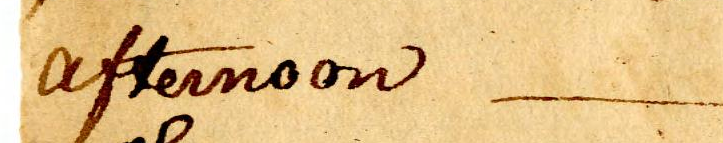Afternoon-
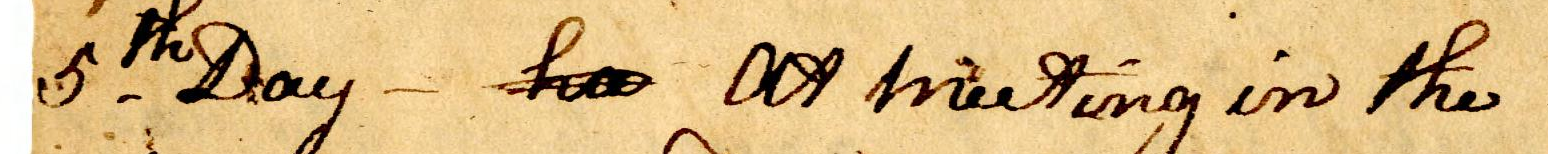5^th Day- [ha] At Meeting in the
